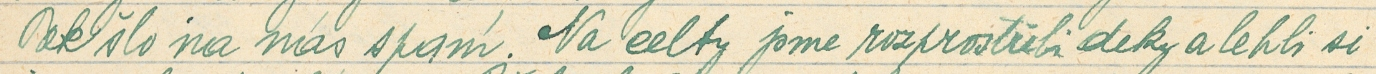Pak šlo na nás spaní. Na celty jsme rozprostřeli deky a lehli si
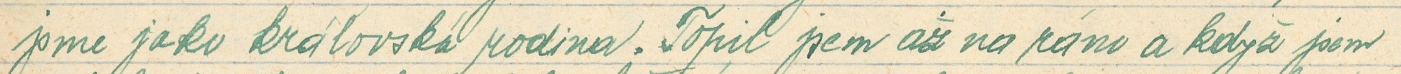jsme jako královská rodina. Topil jsem až na ráno a když jsem
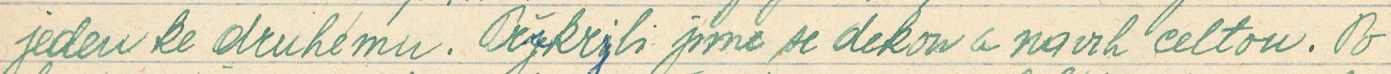jeden ke druhému. Přikryli jsme se dekou a navrh celtou. Po
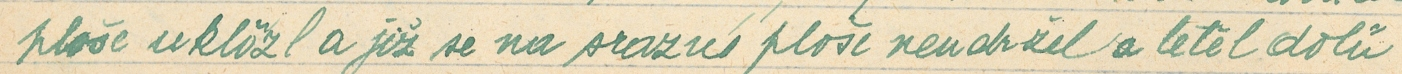ploše uklouzl a již se na srazné ploše neudržel a letěl dolů
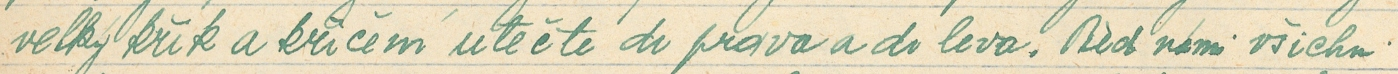velký křik a křičení utečte do prava a do leva. Před námi všichni
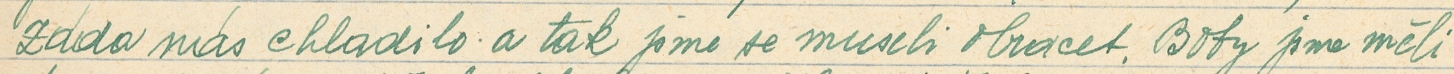záda nás chladilo a tak jsme se museli obracet. Boty jsme měli
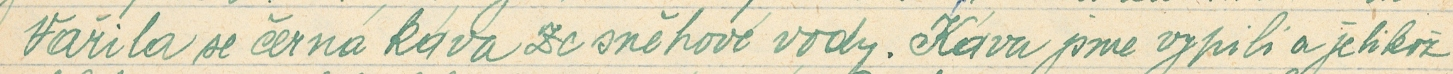Vařila se černá káva ze sněhové vody. Kávu jsme vypili a jelikož
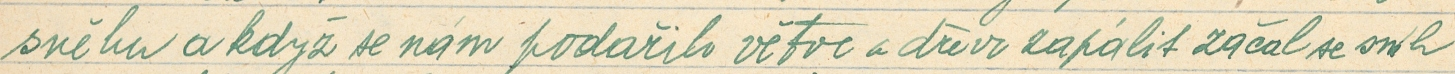sněhu a když se nám podařilo větve a dřevo zapálit začal se sníh
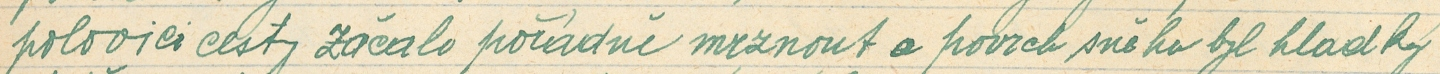polovici cesty začalo pořádně mrznout a povrch sněhu byl hladký.
